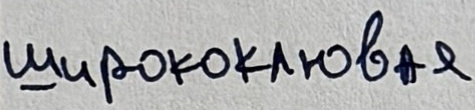ширококлювая
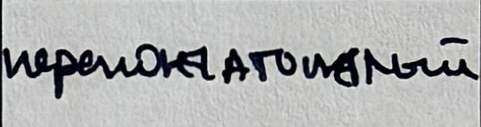перепончатопалый
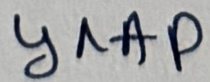улар
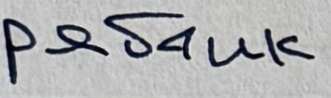рябчик
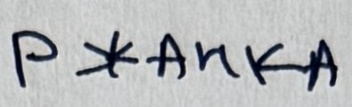ржанка
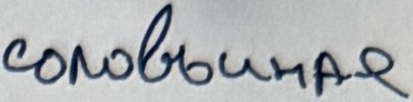соловьиная
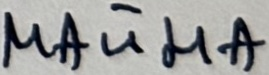майна
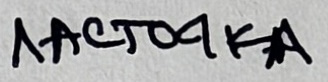ласточка
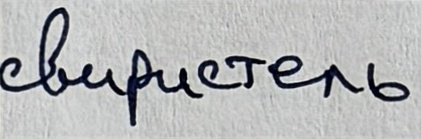свиристель
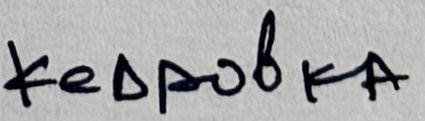кедровка
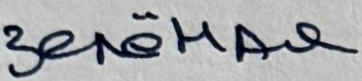зелёная
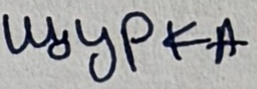щурка
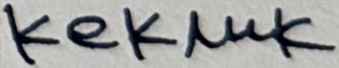кеклик
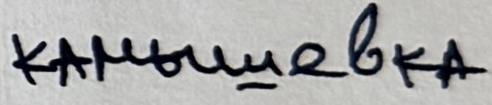камышевка
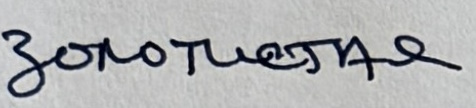золотистая
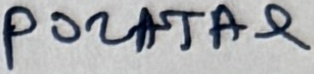рогатая
